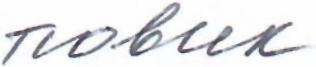тювик
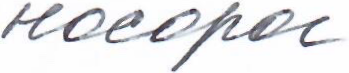носорог
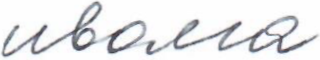иволга
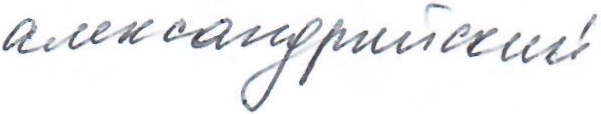александрийский
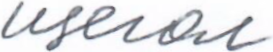щегол
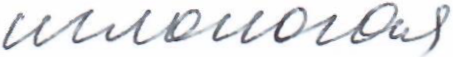иглоногая
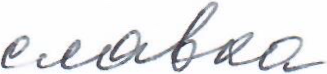славка
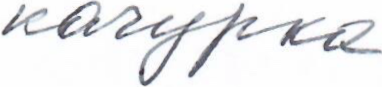качурка
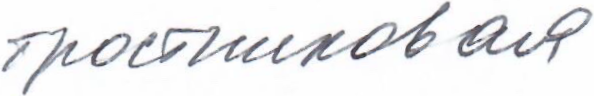тростниковая
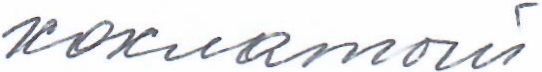хохлатый
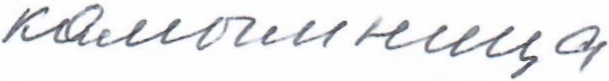камышница
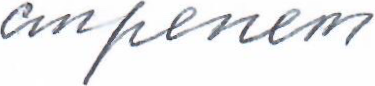стрепет
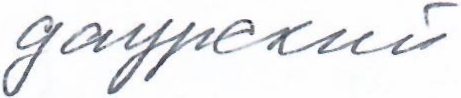даурский
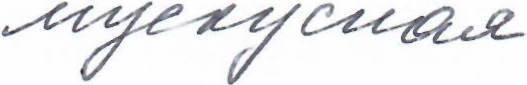мускусная
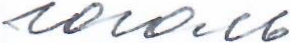гоголь
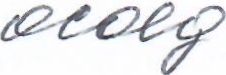осоед
